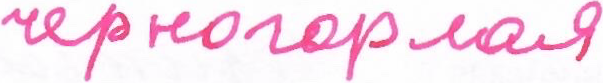черногорлая
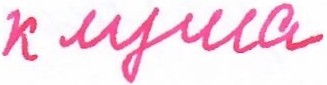клуша
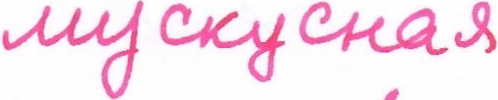мускусная
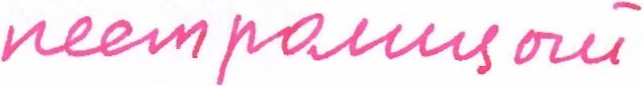пестролицый
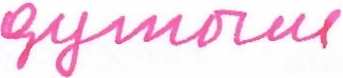дутыш
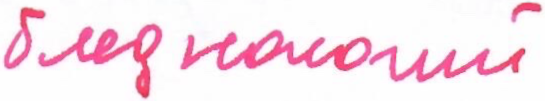бледноногий
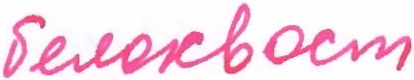белохвост
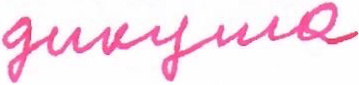дикуша
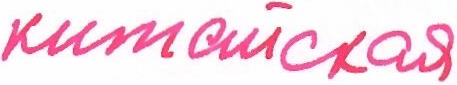китайская
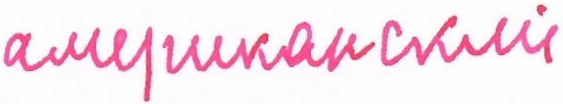американский
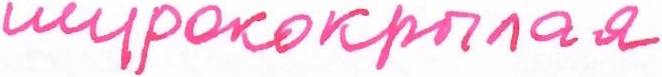ширококрылая
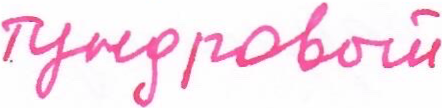тундровый
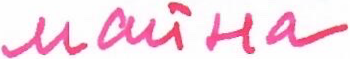майна
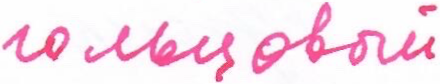гольцовый
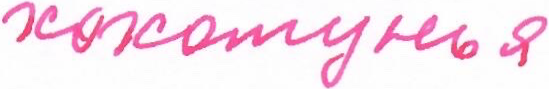хохотунья
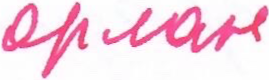орлан
